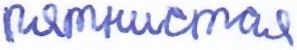пятнистая
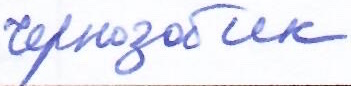чернозобик
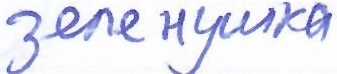зеленушка
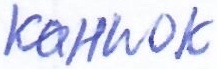канпок
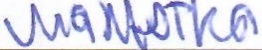малютка
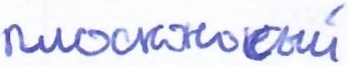плосконосый
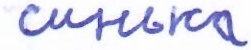синька
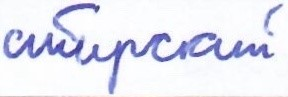сибирский
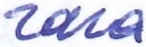гага
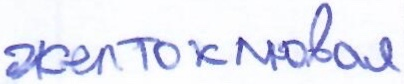желтоклювая
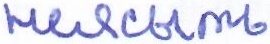неясыть
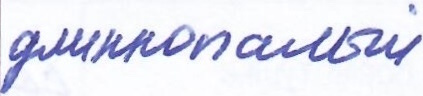длиннопалый
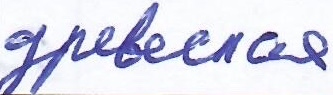древесная
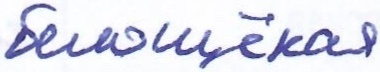белощёкая
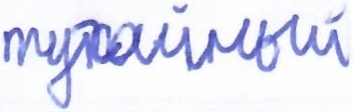тутайный
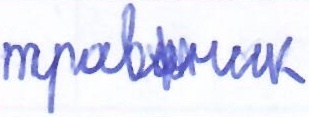травник
